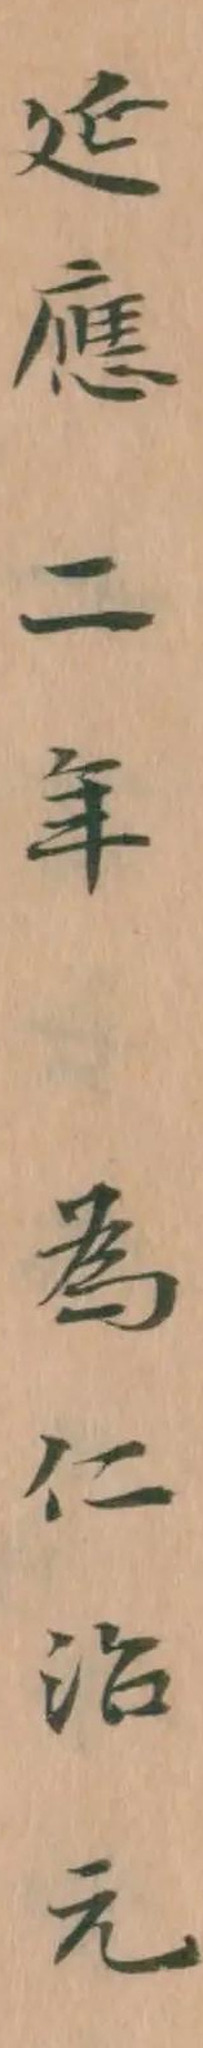延応二年為仁治元
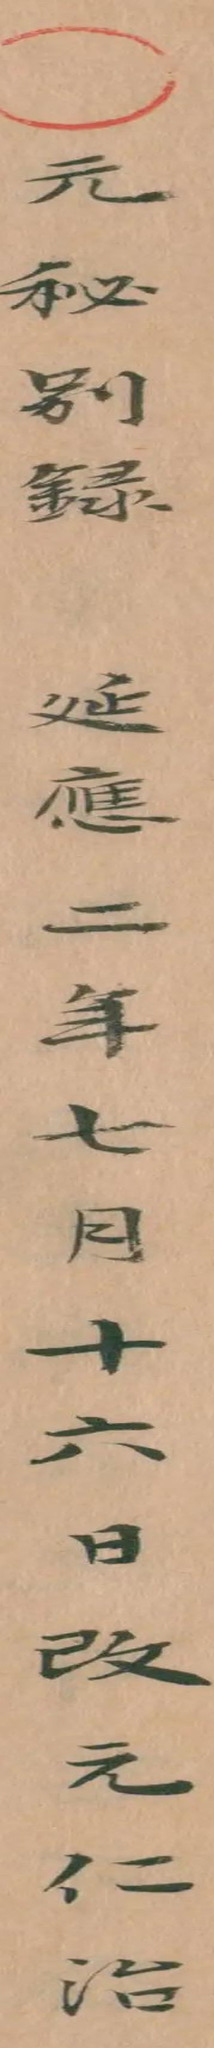○元秘別録延応二年七月十六日改元仁治
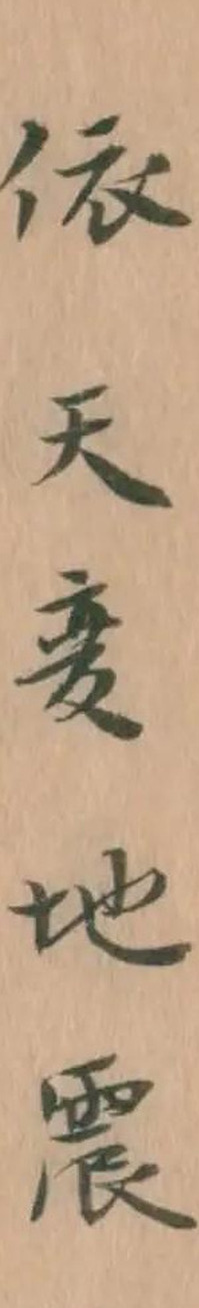依天変地震
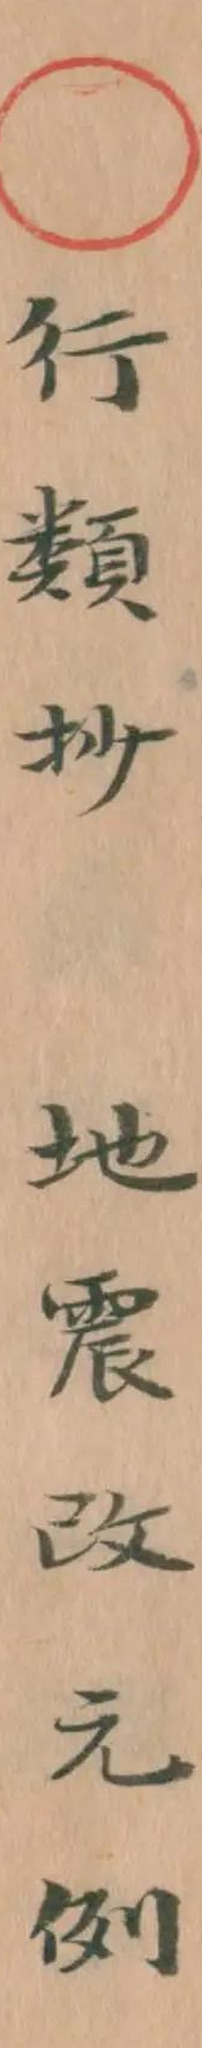○行類抄地震改元例
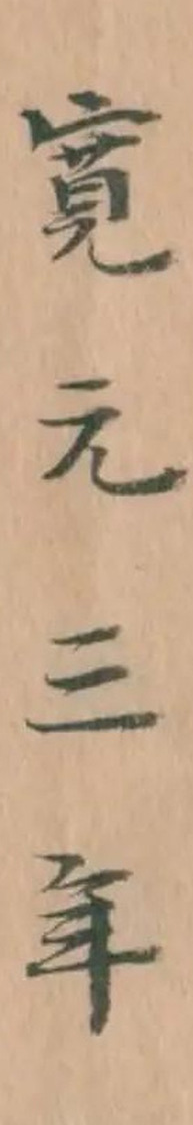寛仁三年

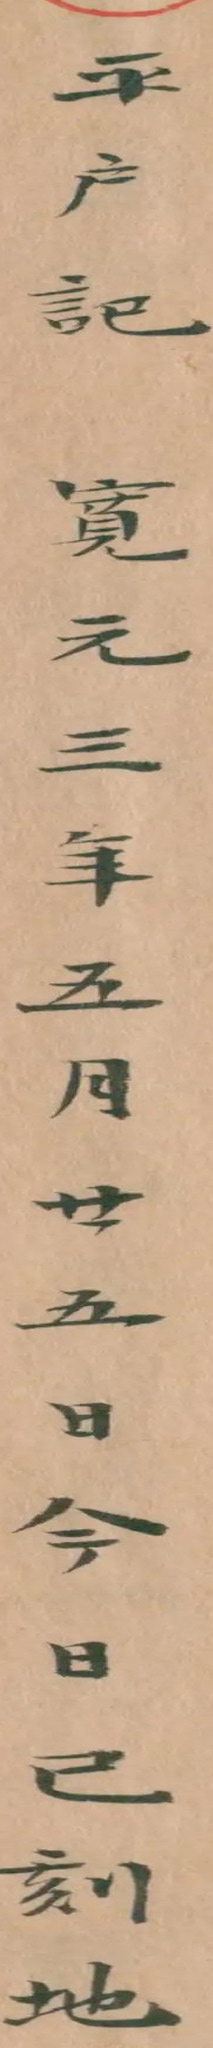○平戸記寛元三年五月廿五日今日巳刻地
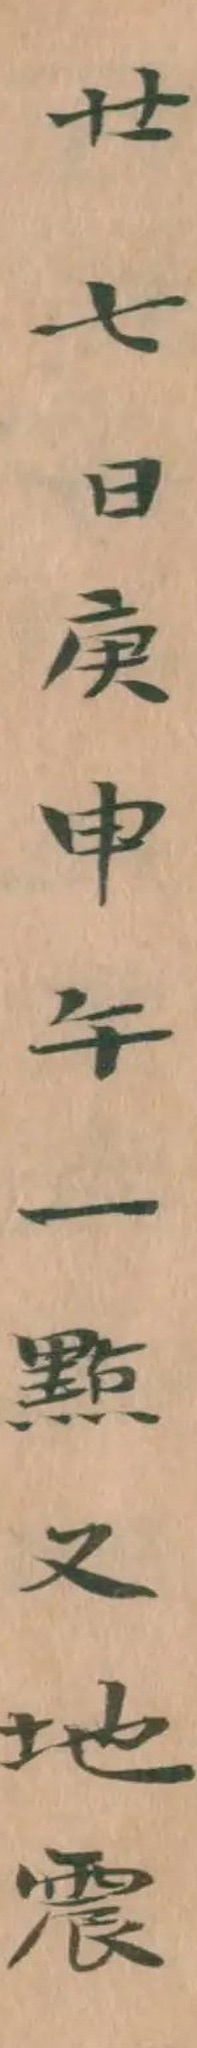廿七日庚申午一点又地震
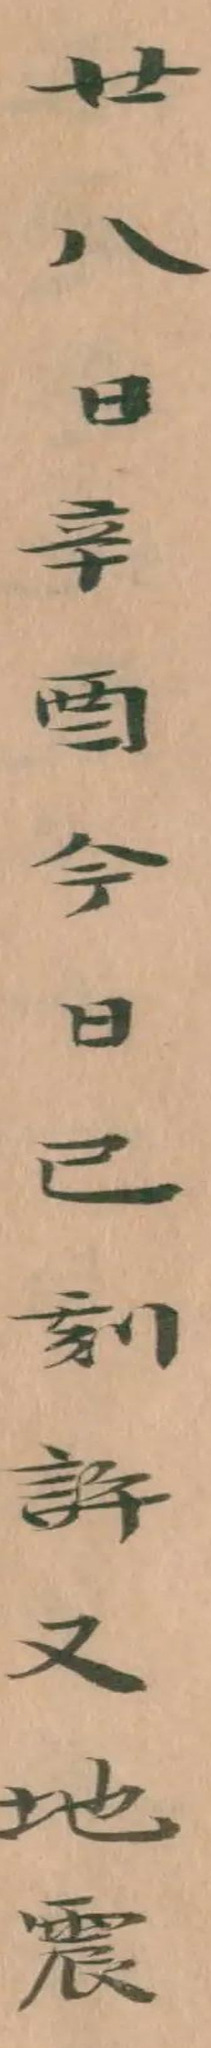廿八日辛酉今日巳刻許又地震
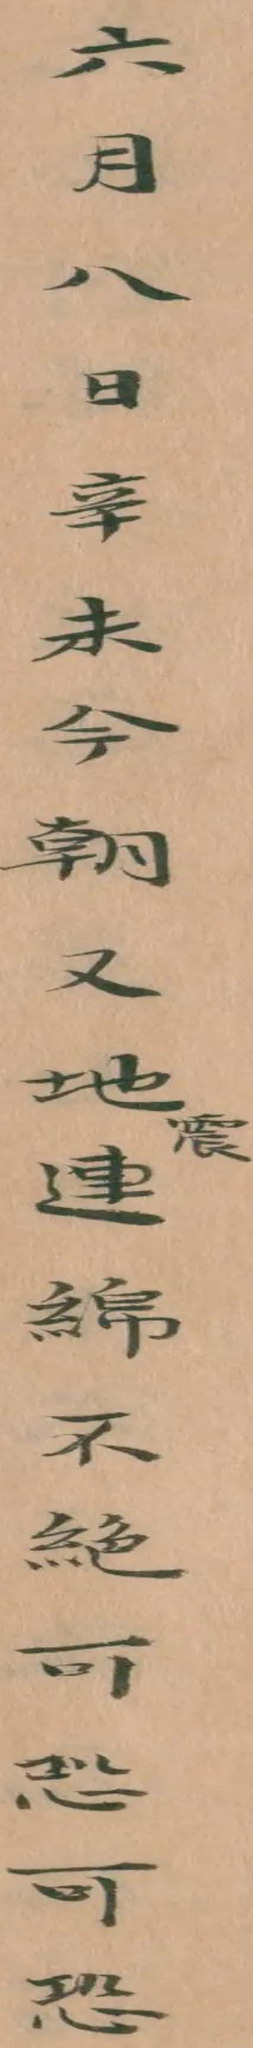六月八日辛未今朝又地震連綿不絶可恐可恐
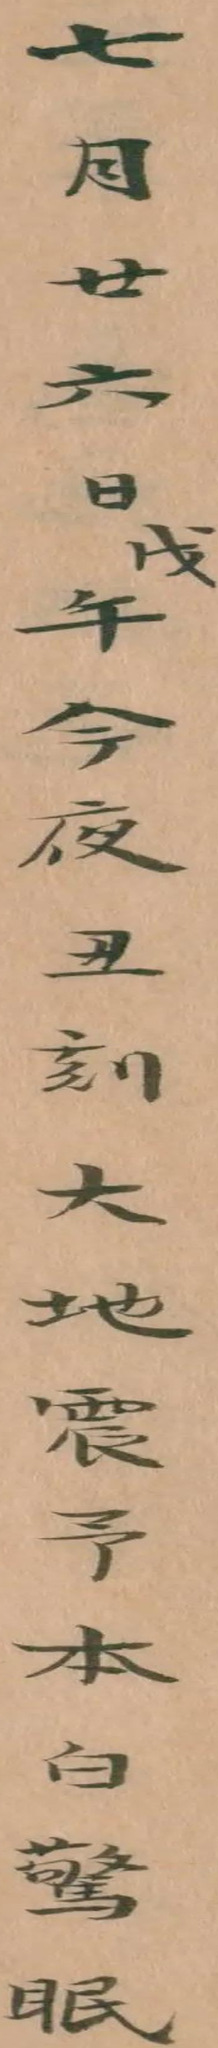七月廿六日戊午今夜丑刻大地震予本白驚眠
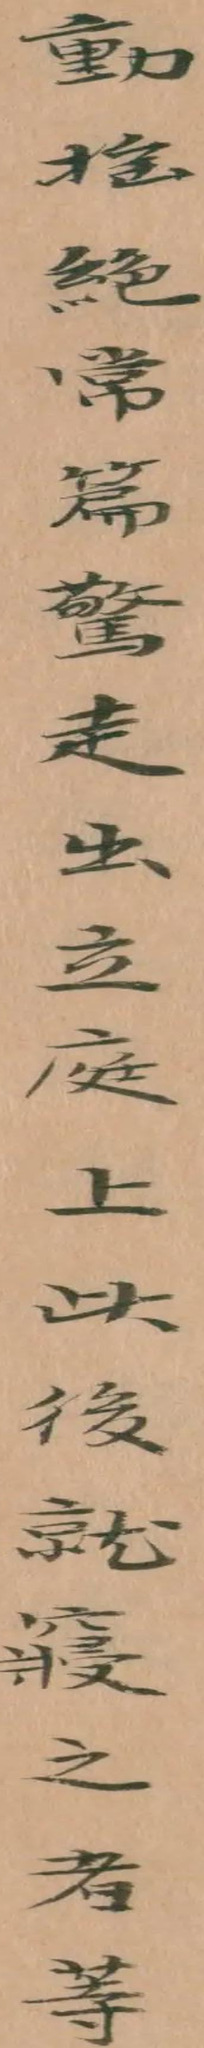動揺絶常篇驚走出立庭上此後就寝之者等
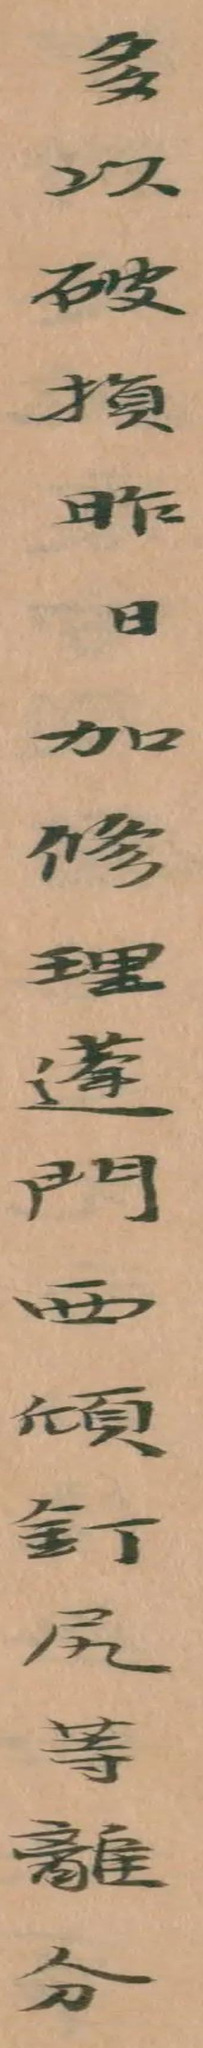多以破損昨日加修理蓬門西傾釘尻等離分
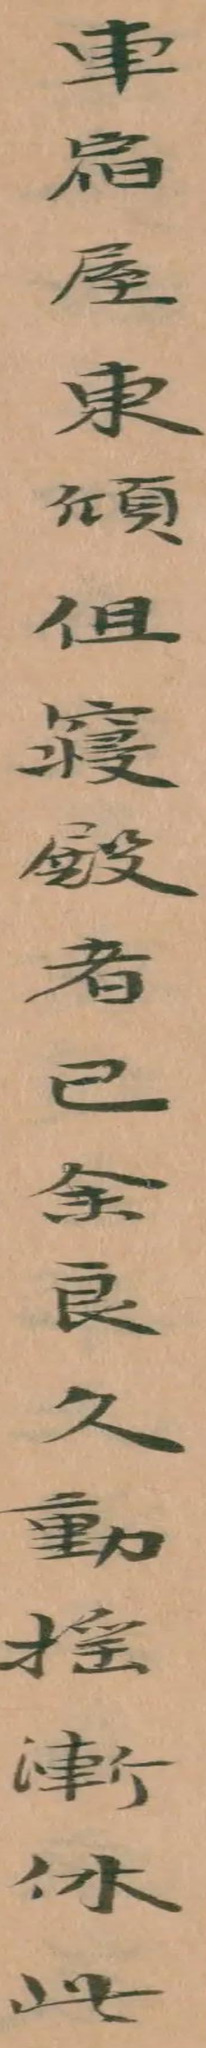車宿屋東傾但寝殿者己余良久動揺漸休此
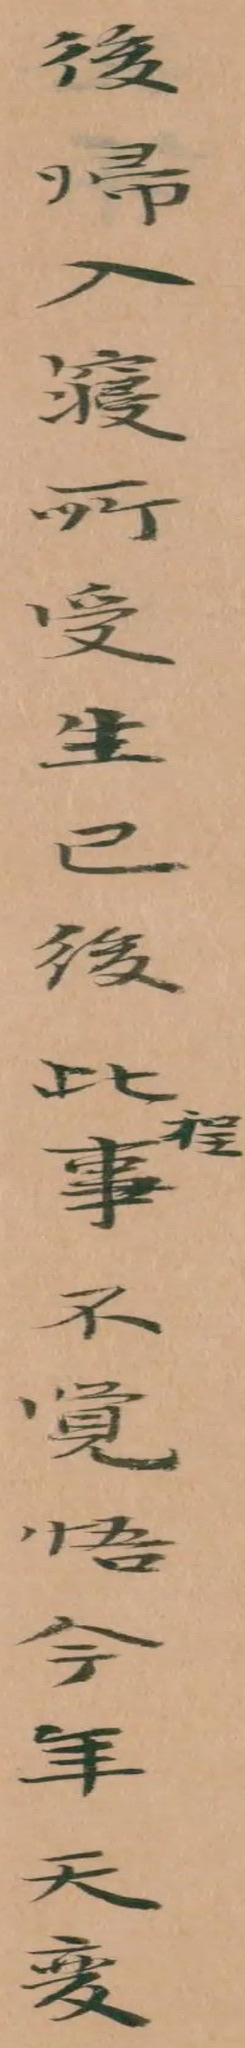後帰入寝所受生已後此程事不覚悟今年天変
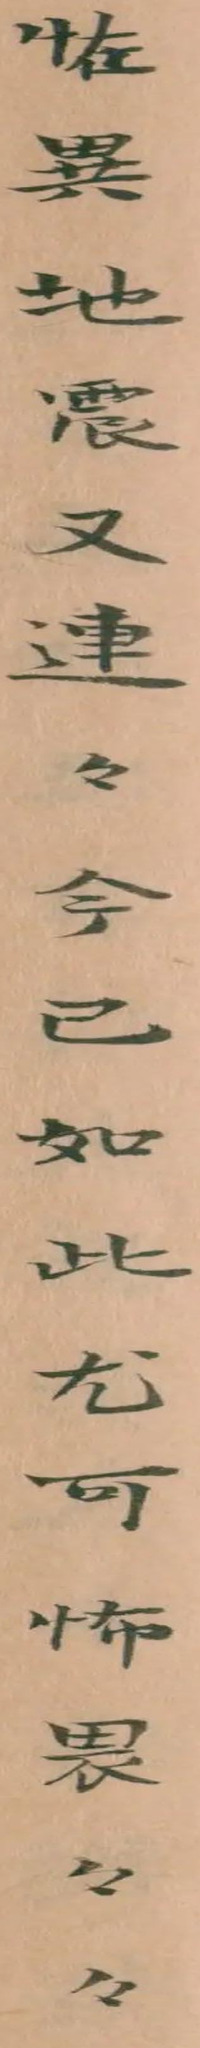恠異地震又連々今已如此尤可怖畏々々
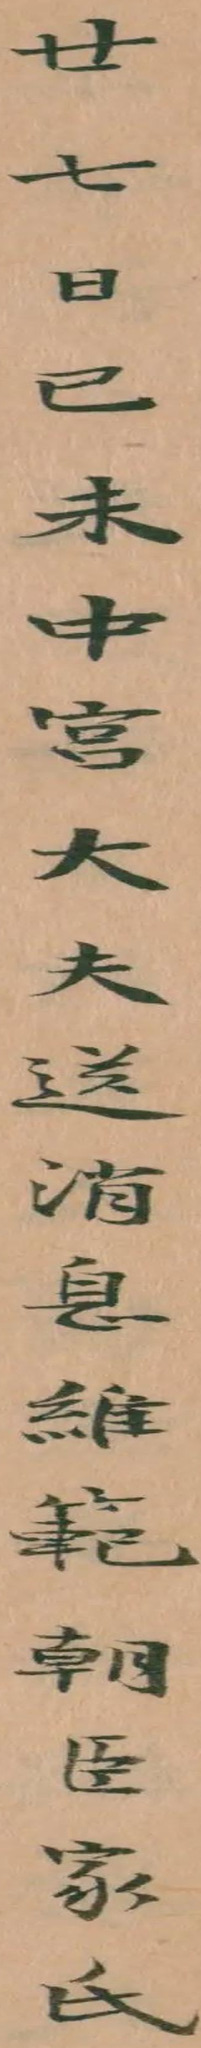廿七日己未中宮大夫送消息維範朝臣家氏
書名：地災撮要. 巻5-6(地震之部)
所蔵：国立国会図書館 National Diet Library, JAPAN
